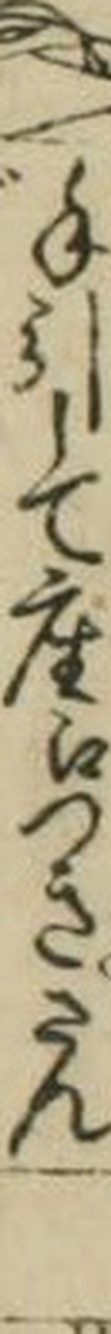手引して座えつき。さん
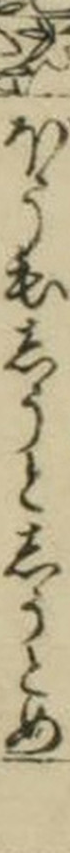ぼう出しうとしうとめ
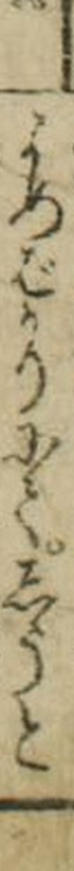よめばかりにて。しうと
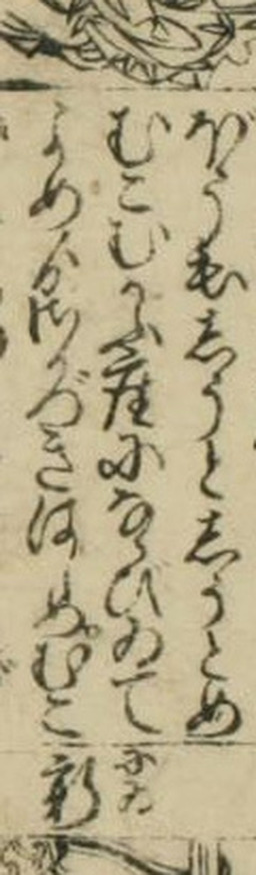むこむかふ座にならびゐて
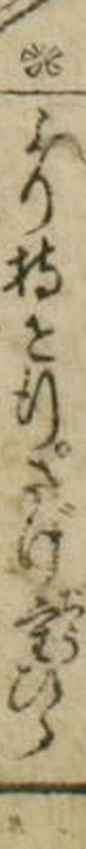より持せ行。さげ重ひら
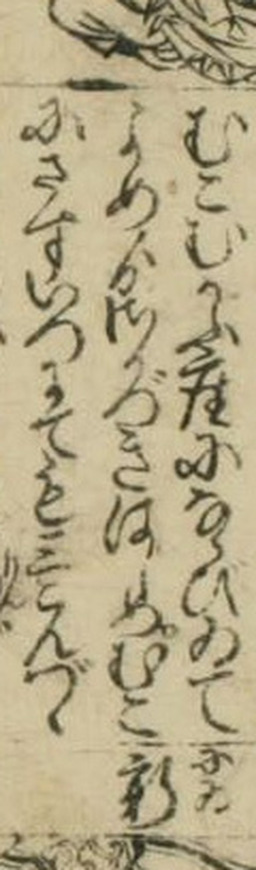よめよりさかづきはじめ。むこ
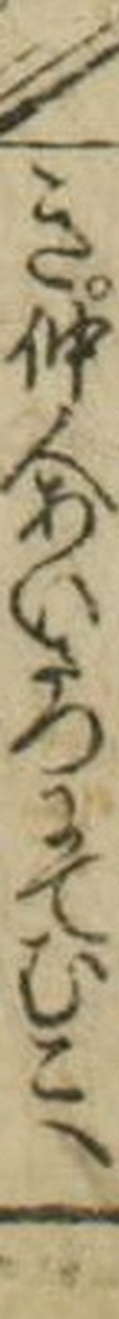き仲人あいさつにてむこへ
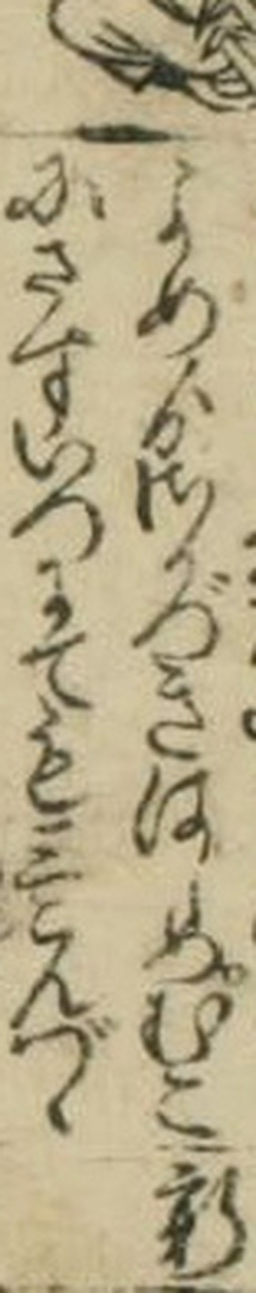にさすいつにても三こんづゝ
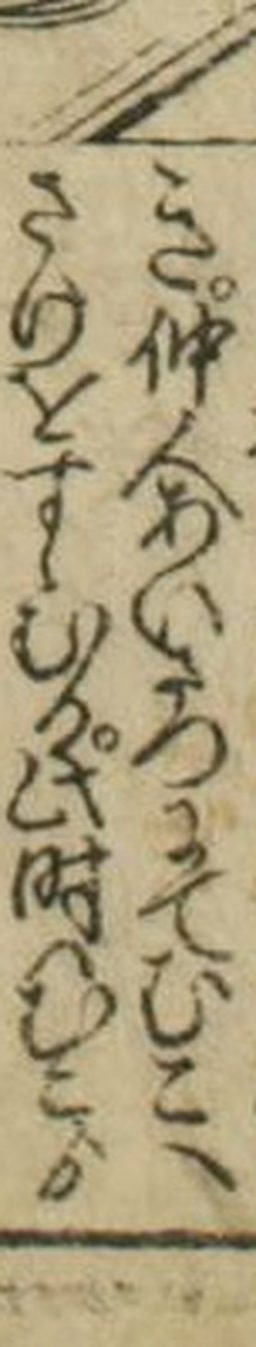さけをすゝむる。此時はむこより
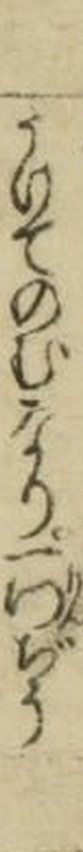うけてのむなり。一門ぢう
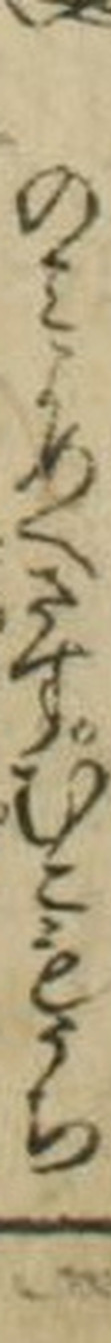のみよめへさす。むこもうち
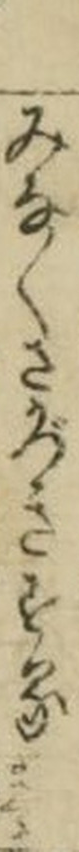みな〳〵さかづきする
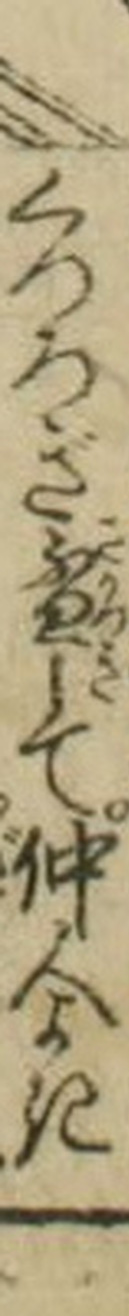くつろぎ盃して。仲人よき
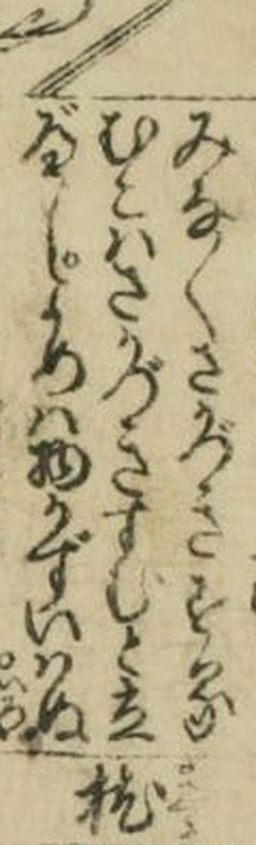むこはさかづきすむと立
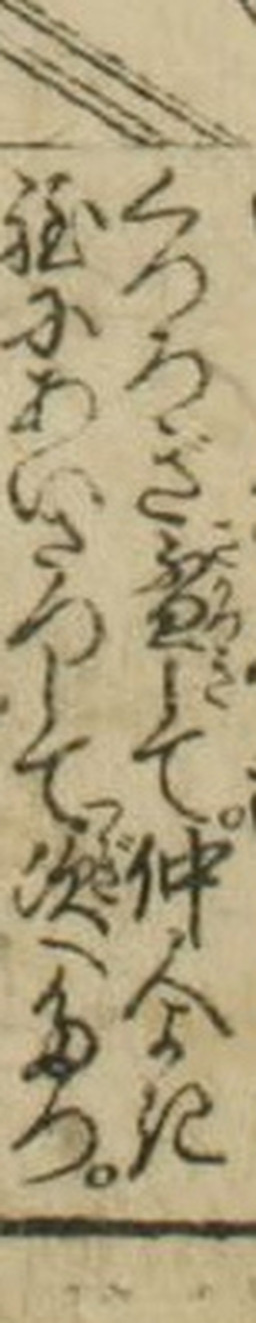程にあいさつして次へたつ。
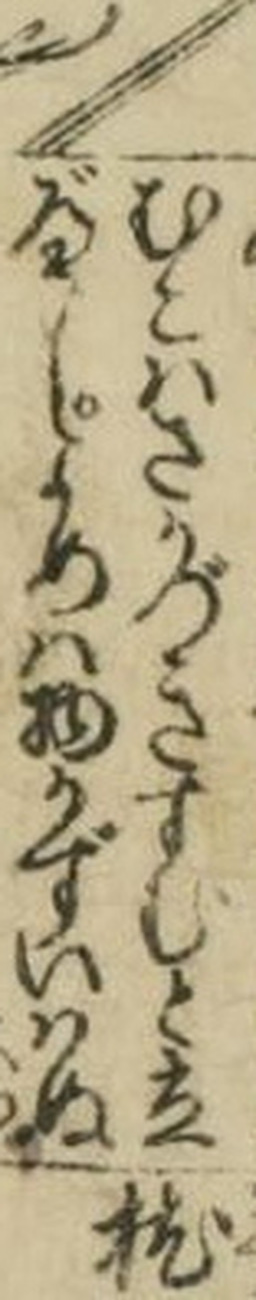べし。よめは物かずいはぬ
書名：女源氏教訓鑑
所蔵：東京学芸大学附属図書館
